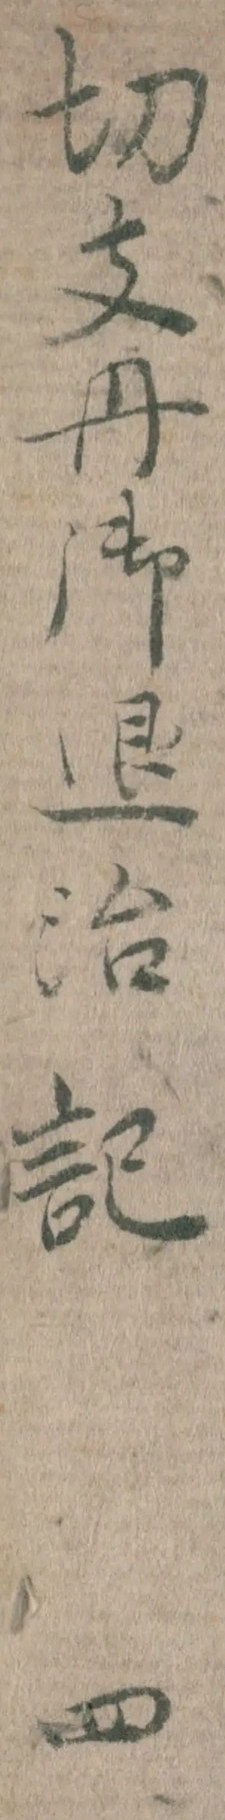切支丹御退治記四

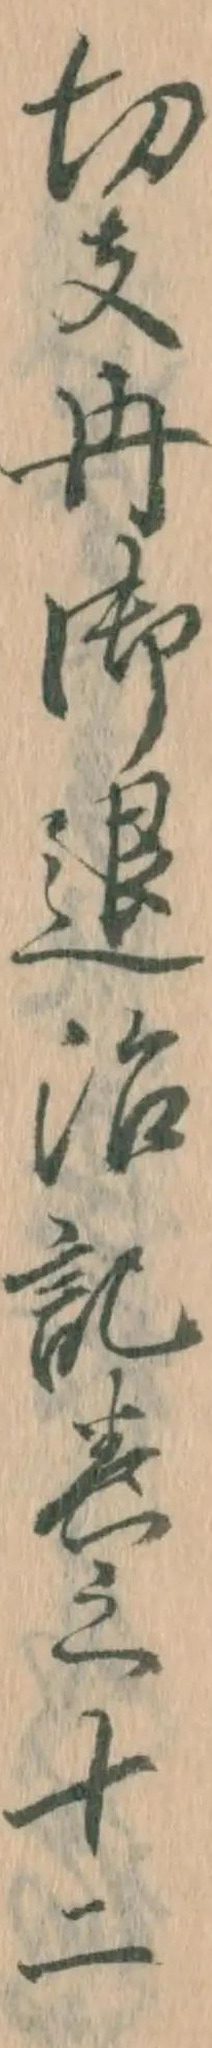切支丹御退治記巻十二
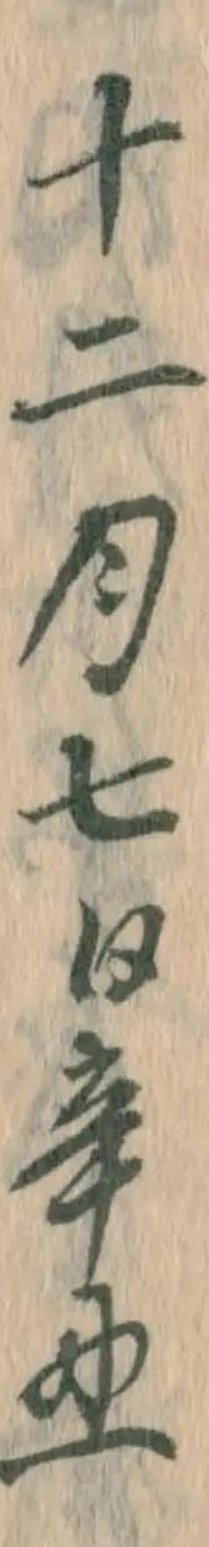十二月七日辛丑
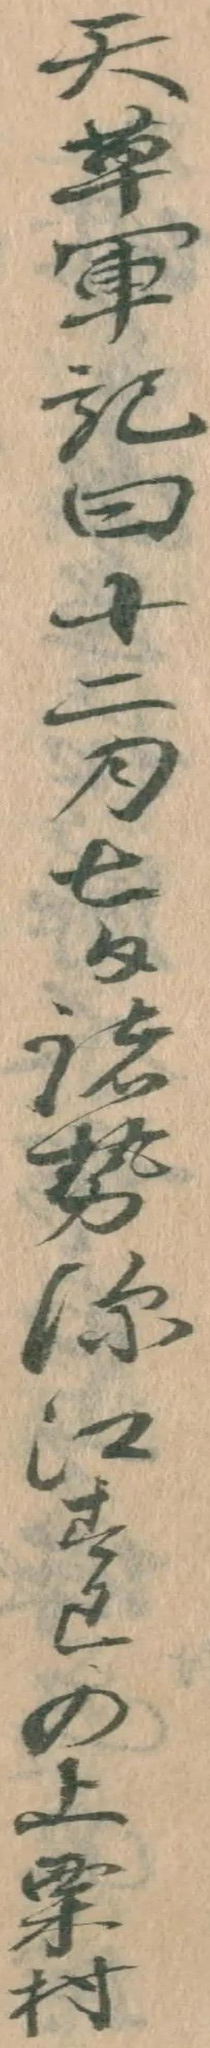天草軍記曰十二月七日諸勢深江春己之上栗村
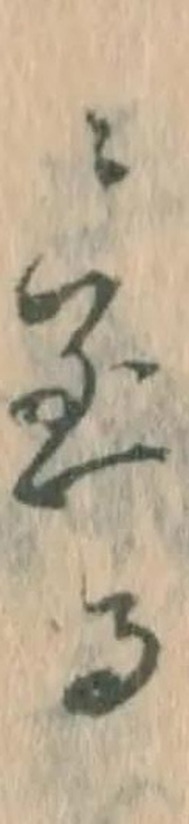に至る
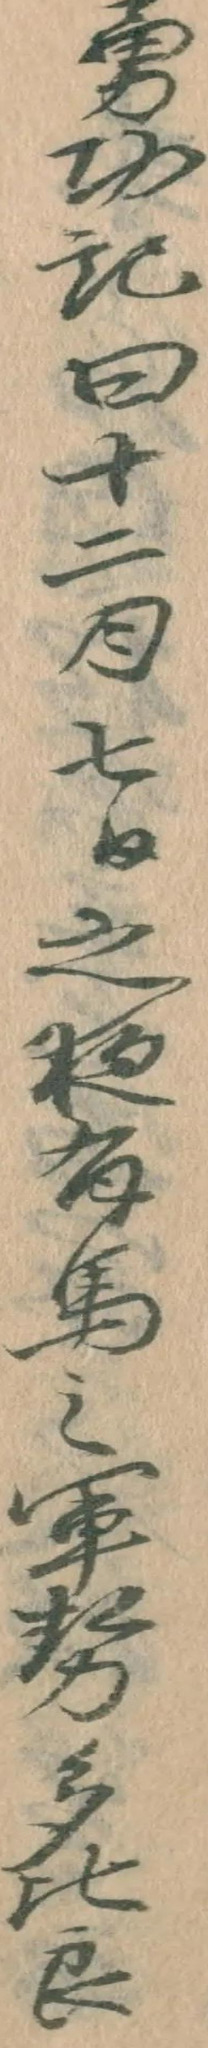勇功記曰十二月七日之夜有馬之軍勢多比良
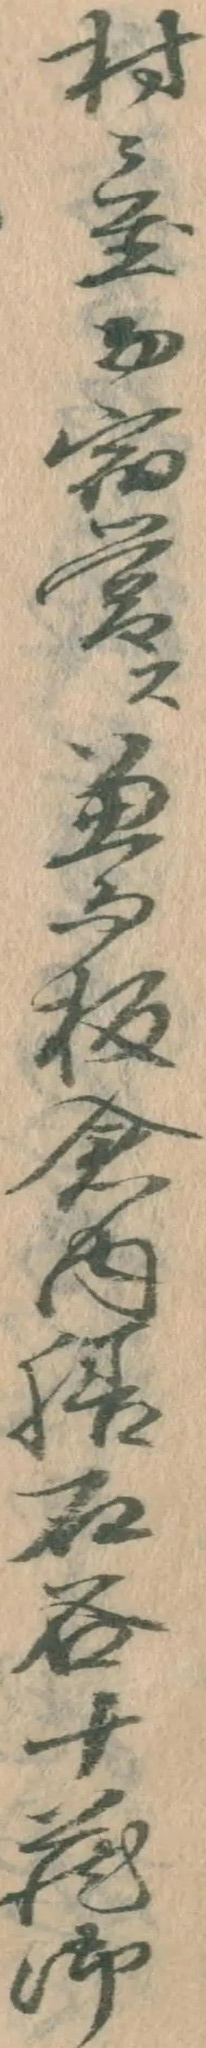村に至而宿営す兼而板倉内膳石谷十蔵御
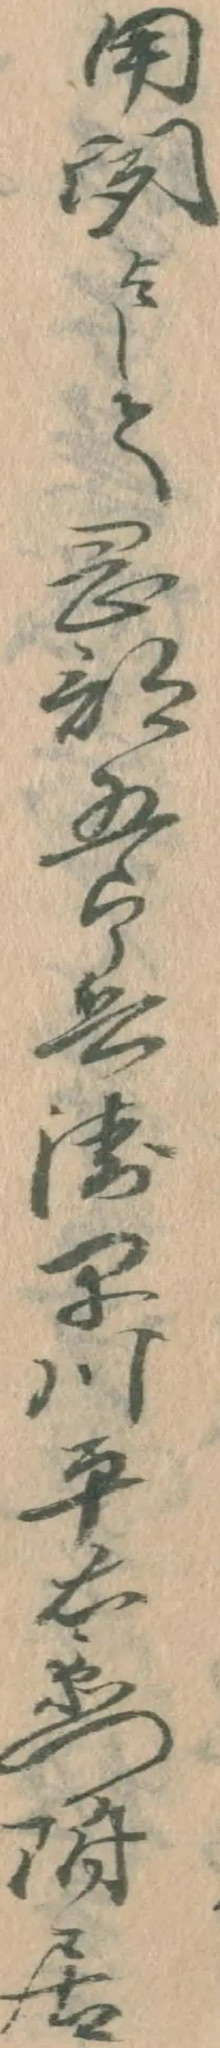用聞与して岡部五郎兵衛早川平右衛門附居
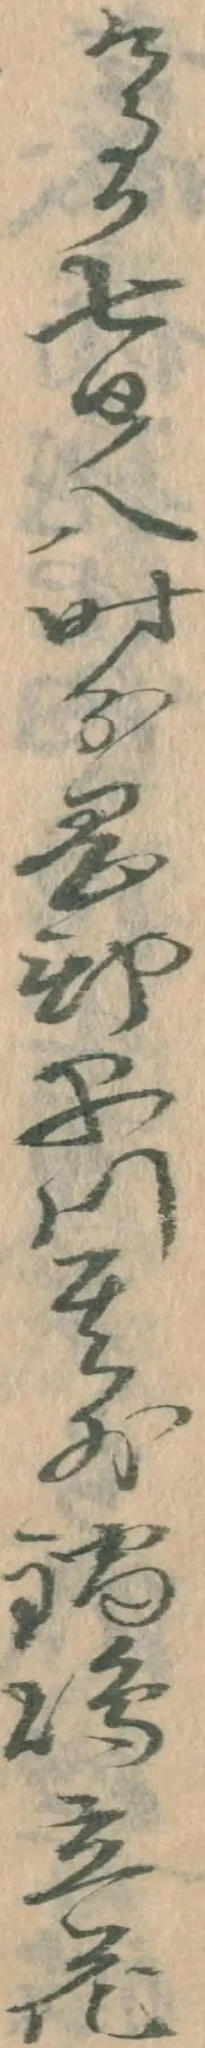けるか七日八時分岡部早川其外鍋島立花
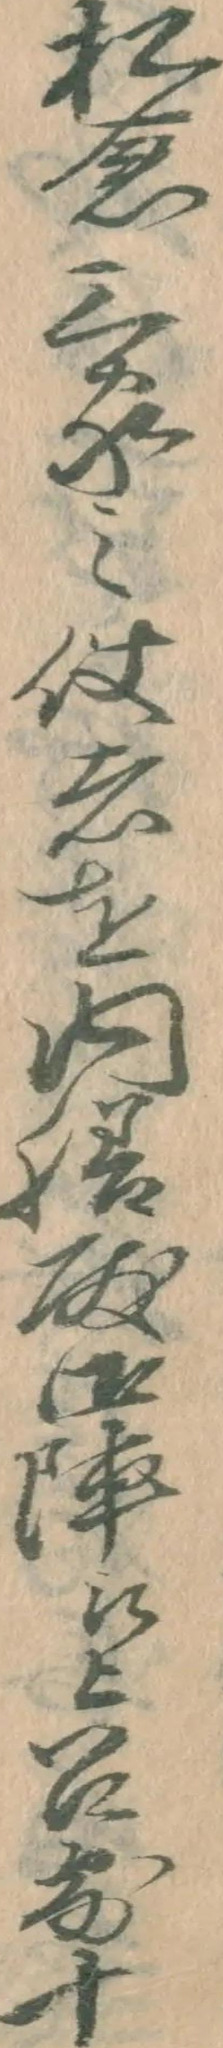松倉三家之使者を内膳殿御陣江被召寄十

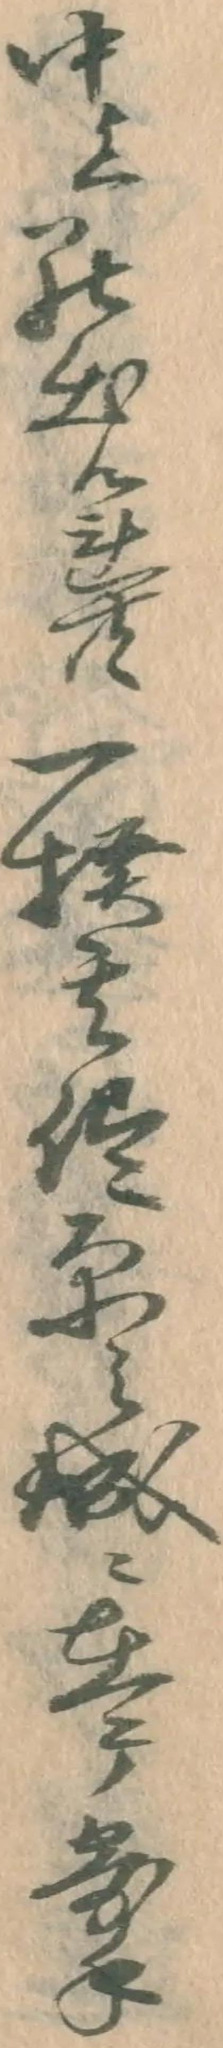中与罷出る連共一揆其侭原之城に在て寄手
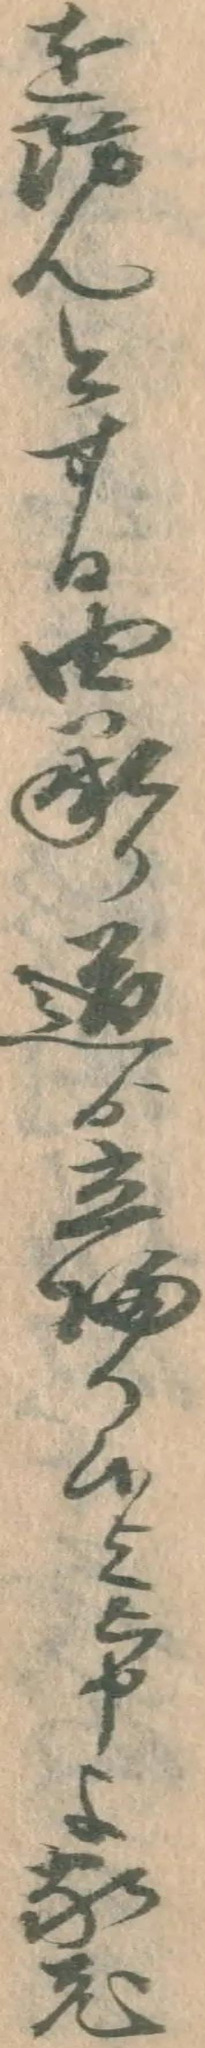を防んとする由承り道ゟ立帰り候与被申尓家老
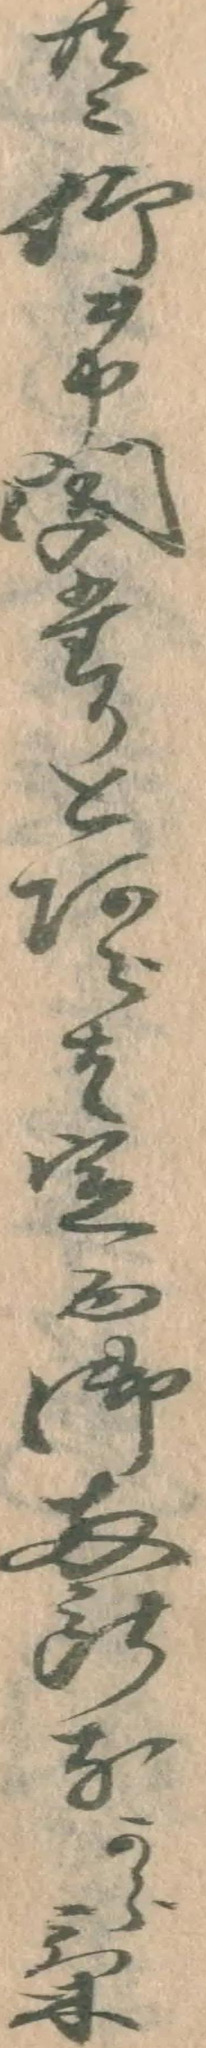共に仰を申聞堂りと阿ら者定而御両所なから気
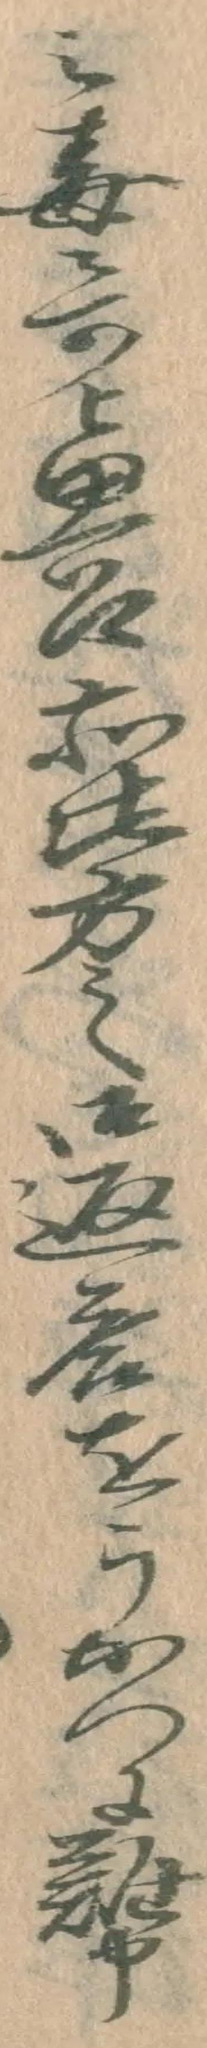之毒に可被思召所此方之御返答をうかつ尓難申
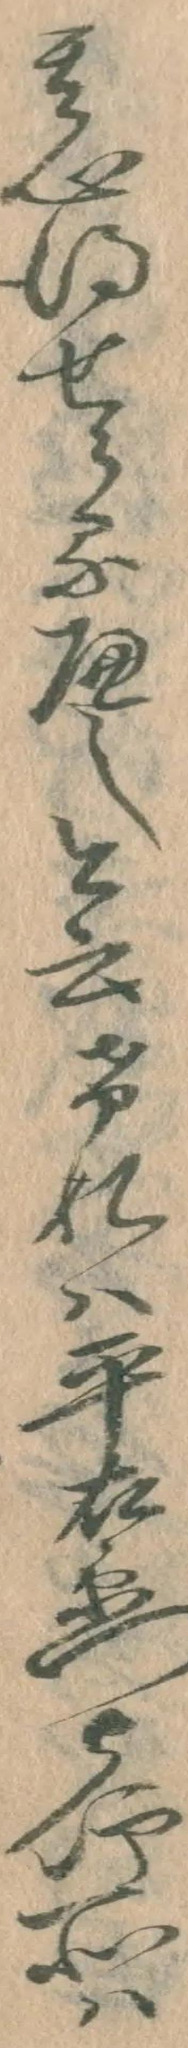其心得せら累扁しと云希れは平右衛門被仰所は
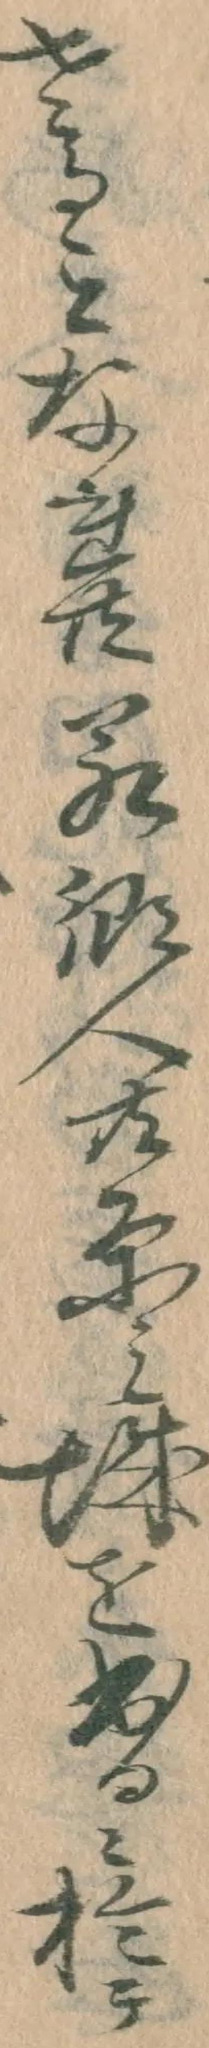さることな連共若郷人共原之城を出るに於て
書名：切支丹御退治記 49巻. [4]
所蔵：国立国会図書館 National Diet Library, JAPAN
